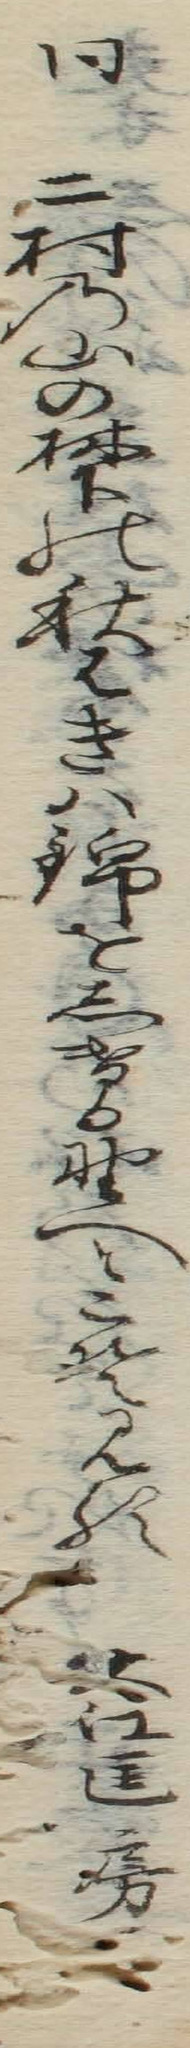同二村の山の麓の秋はきは錦をしける野へとこそ見る大江匡房

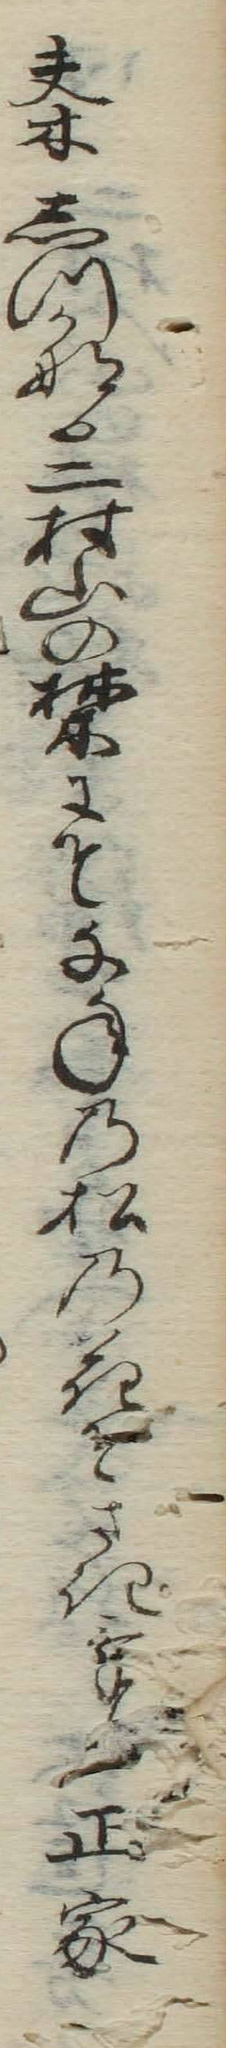夫木しつかなる二村山の麓にそ千年の松の花そさきけ正家
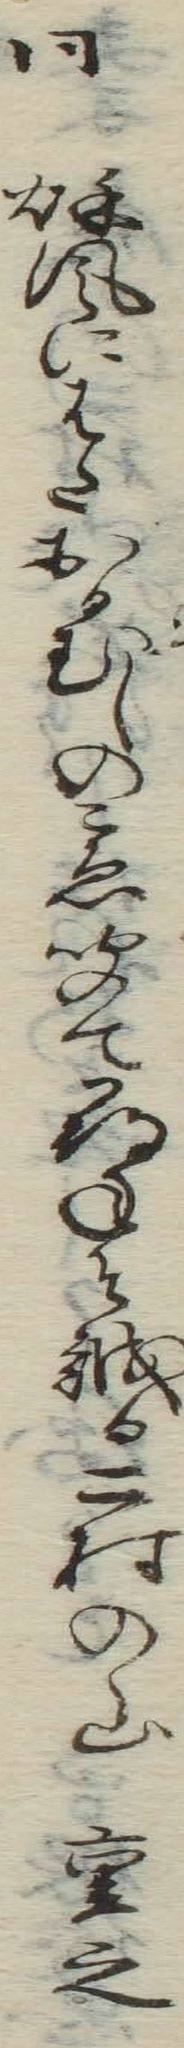同秋風にはたおるむしのこゑ聞て尋ねそ越る二村の山重之
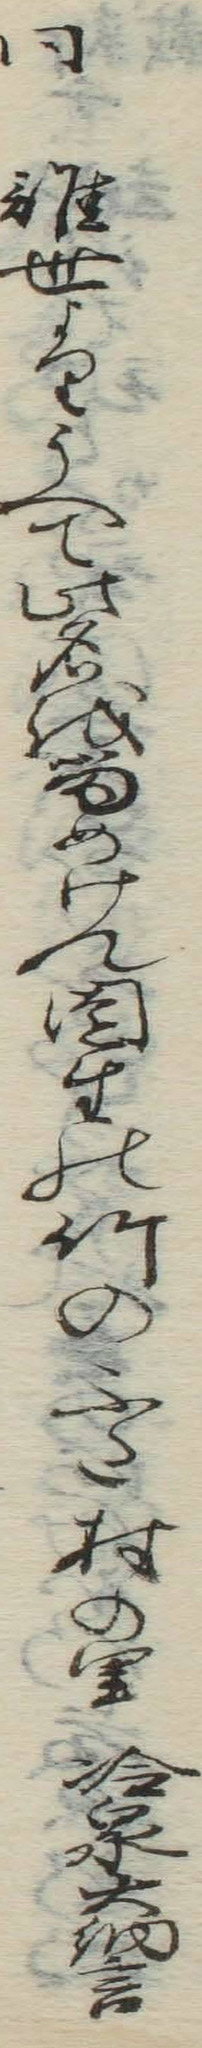同誰世よりうへて此名を留めけん園生の竹のふた村の里冷泉大納言
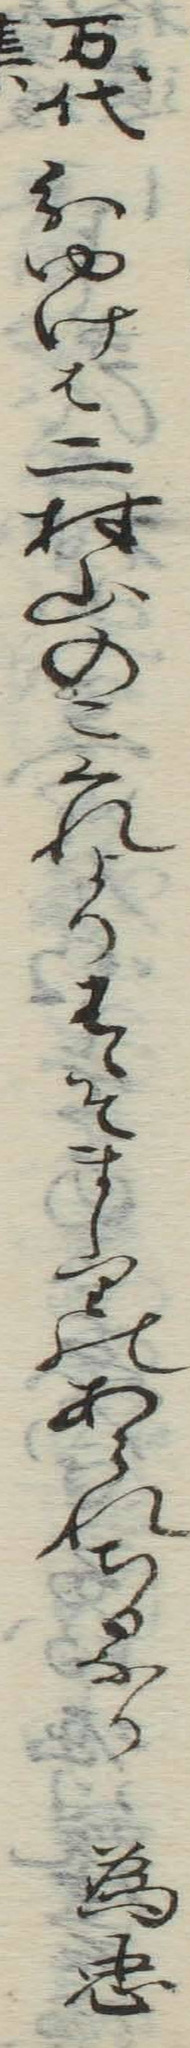万代集分ゆけは二村山のこくれよりはゝそましりのあられちるなり為忠
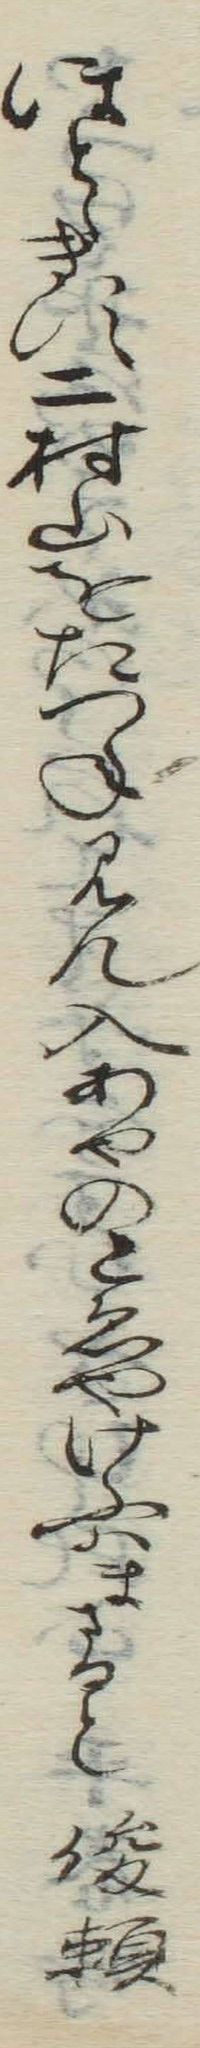ほとゝきす二村山をたつね見ん入あやのこゑやけふはまさると俊頼
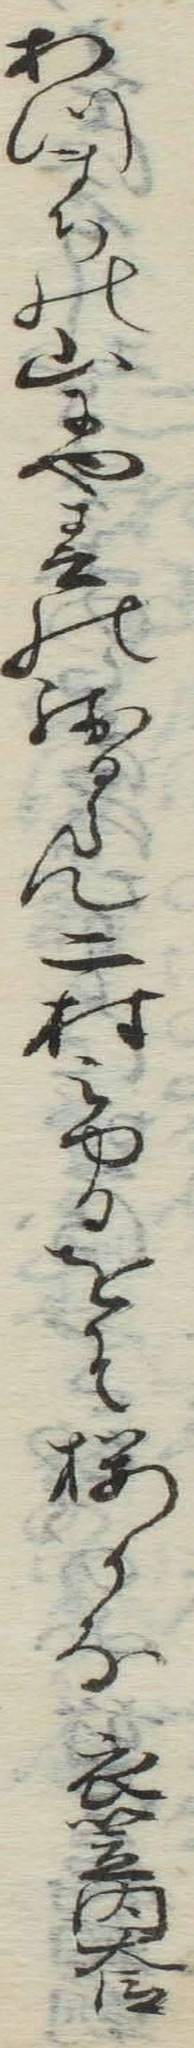あつまちの山にや春の残るらん二村みゆるをそ桜かな衣笠内大臣
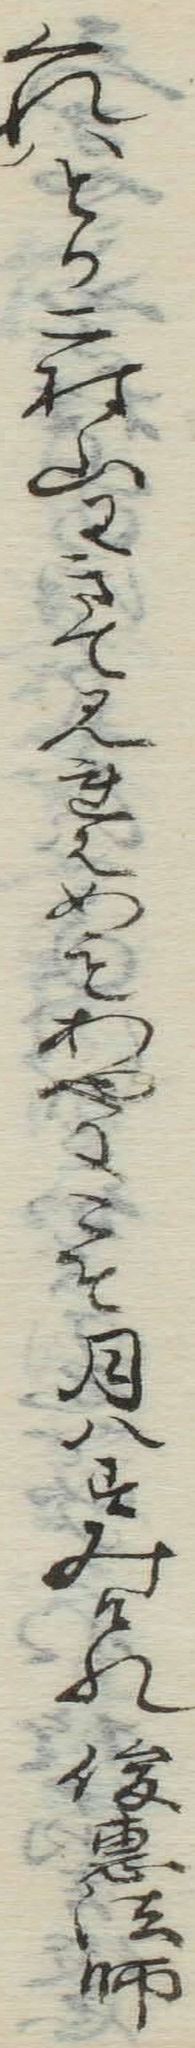くれはとり二村山にきて見れはめもあやにこそ月はすみけれ俊恵法師
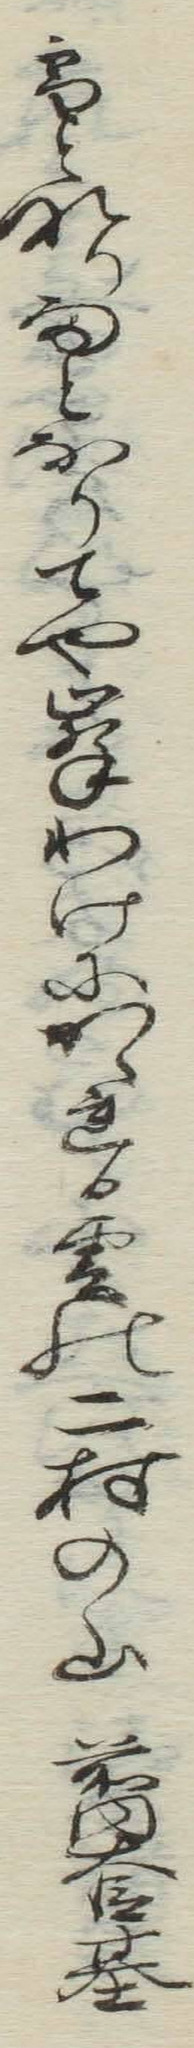雪となり雨となりてや峯わけにかゝれる雲の二村の山前内大臣基
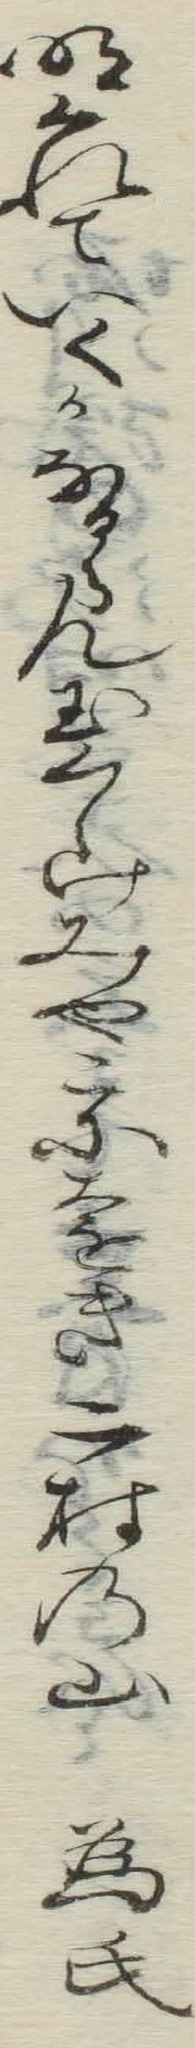明くれていくかなるらん玉くしけみやこに遠き二村の山為氏
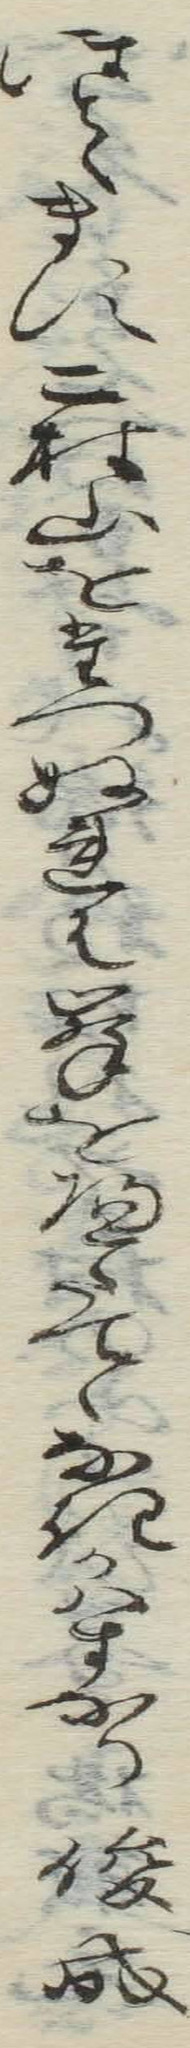ほとゝきす二村山をたつぬれは峯をへたてゝなきかはすなり俊成
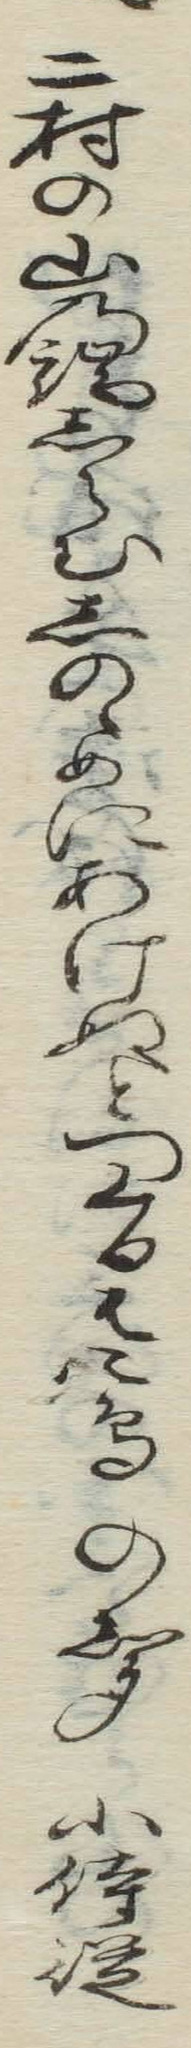藻塩草二村の山の端しらむしのゝめにあけぬとつくるはこ鳥の声小侍従
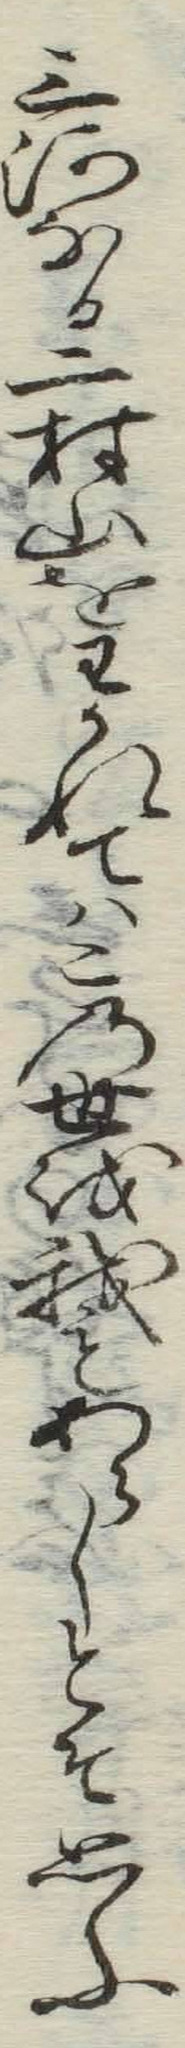三河なる二村山をわかれてはこの世を我もあらしとそ思ふ同人
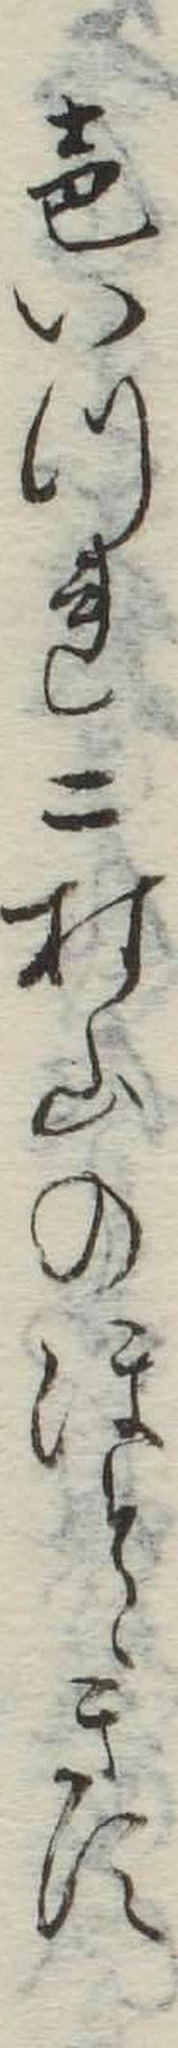声いつれ二村山のほとゝきす昌録
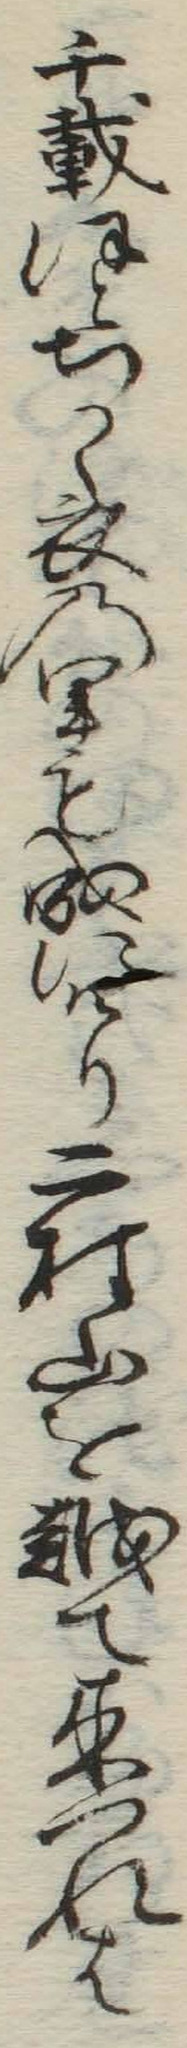千載ほとちかく衣の里も成にけり二村山を越て来つれは経衡
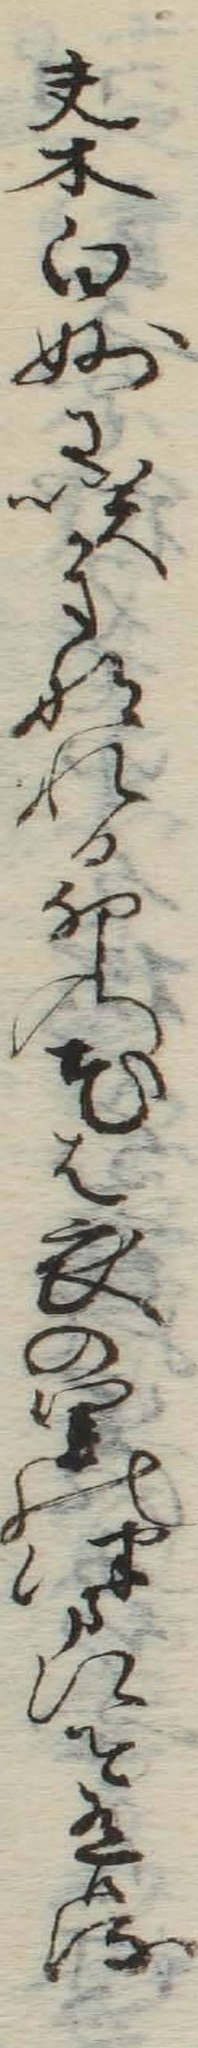夫木白妙に咲きなれる卯の花は衣の里のつまにそ有ける忠隆
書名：三河国二葉松
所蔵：国文学研究資料館
